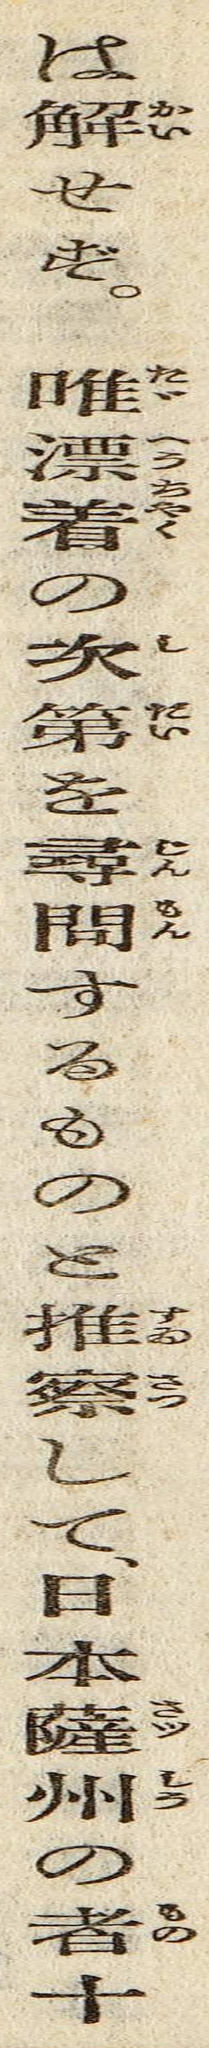は解せず。唯漂着の次第を尋問するものと推察して、日本薩州の者十
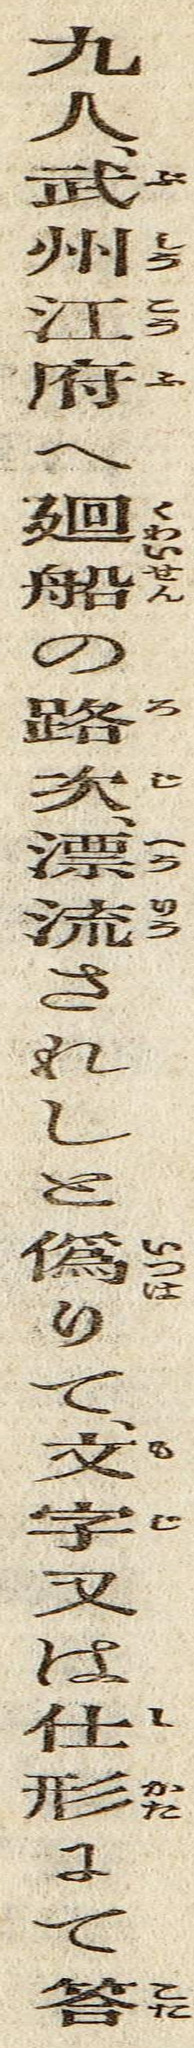九人、武州江府へ廻船の路次、漂流されしと偽りて、文字又は仕形にて答
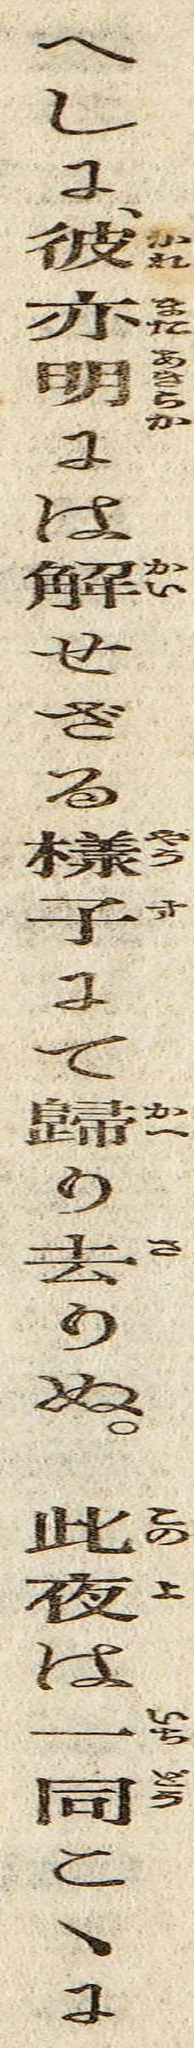へしに、彼亦明には解せざる様子にて帰り去りぬ。此夜は一同こヽに
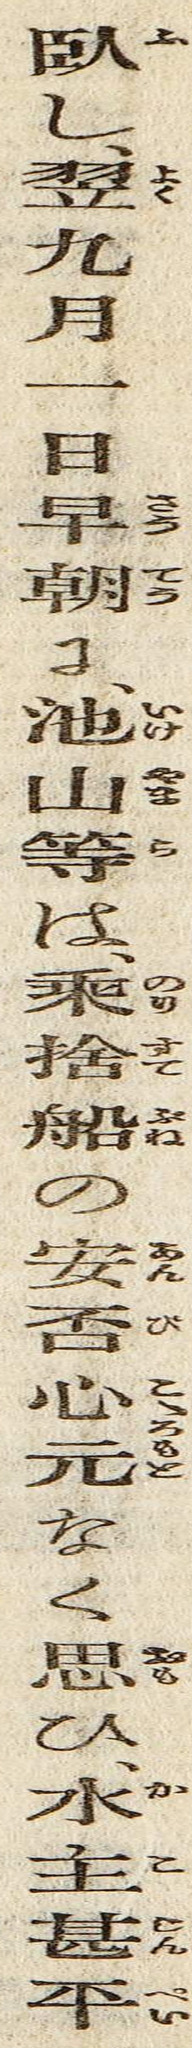臥し、翌九月一日早朝に、池山等は、乗捨船の安否心元なく思ひ、水主甚平
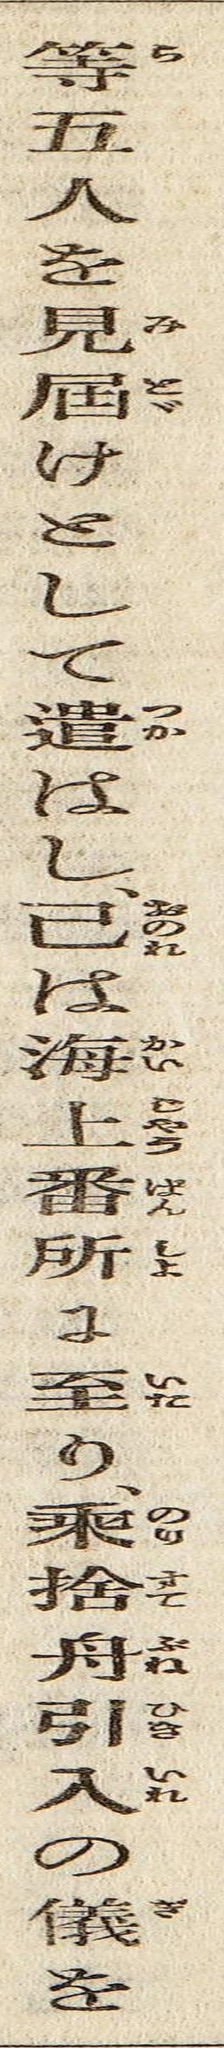等五人を見届けとして遣はし、己は海上番所に至り、乗捨舟引入の儀を
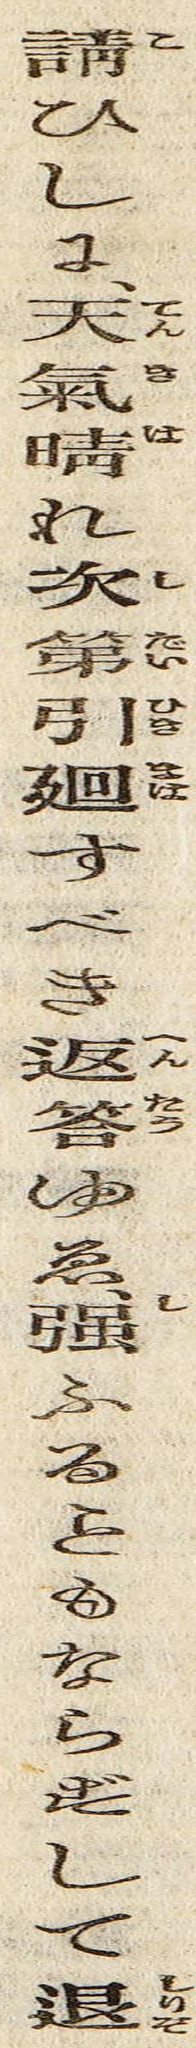請ひしに、天気晴れ次第引廻すべき返答ゆゑ、強ふることもならずして退
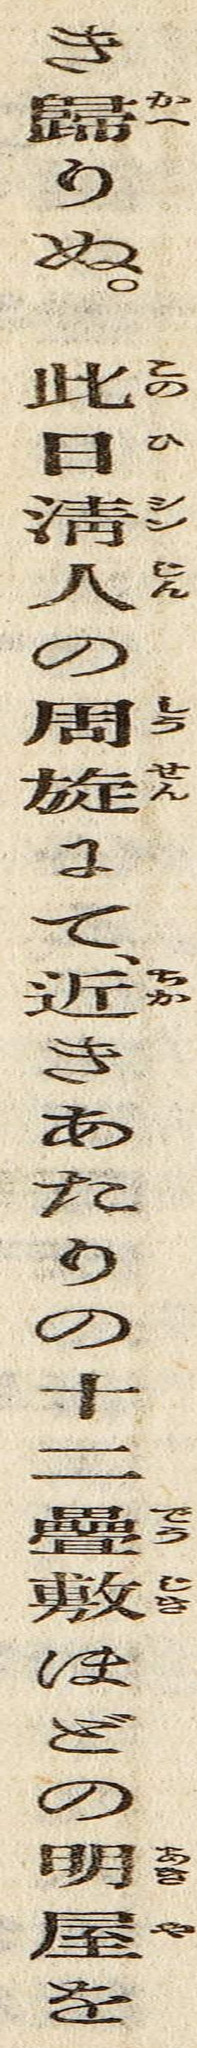き帰りぬ。此日清人の周旋にて、近きあたりの十二畳敷ほどの明屋を
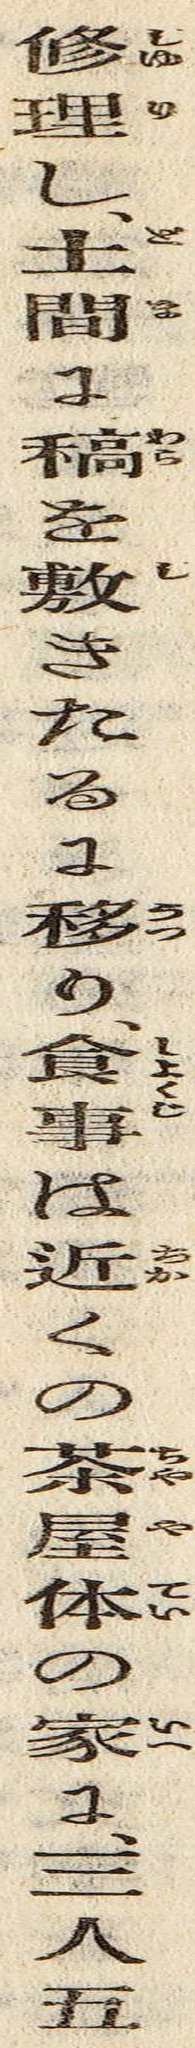修理し、土間に稿を敷きたるに移り、食事は近くの茶屋体の家に、三人五
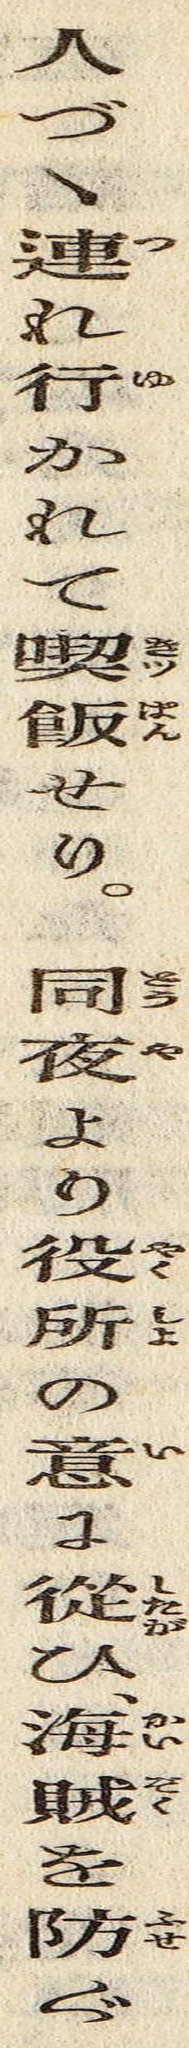人づヽ連れ行かれて喫飯せり。同夜より役所の意に従ひ、海賊を防ぐ
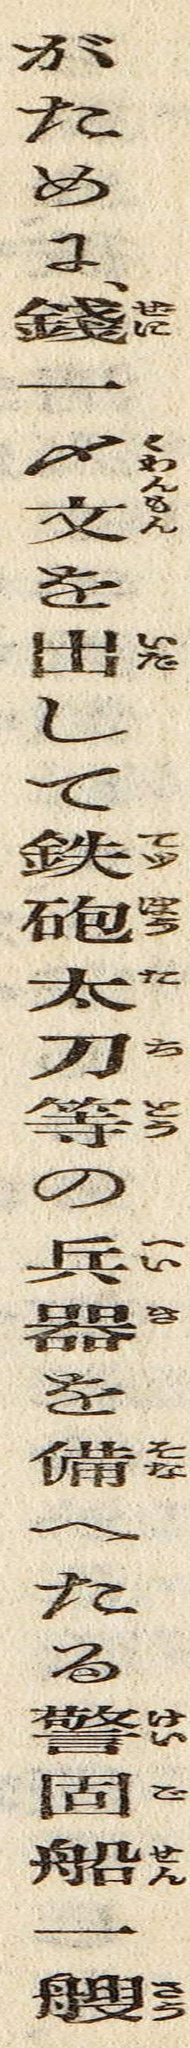がために、銭一貫文を出して鉄砲太刀等の兵器を備へたる警固船一艘
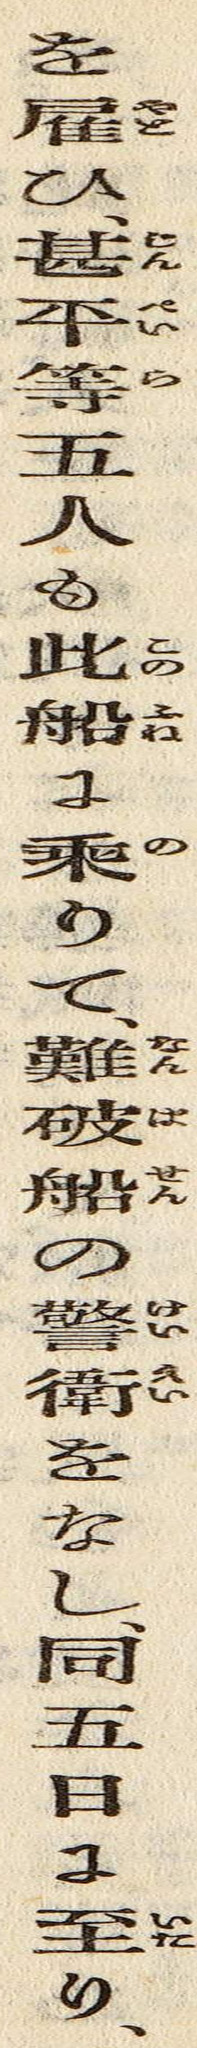を雇ひ、甚平等五人も此船に乗りて、難破船の警衛をなし、同五日に至り、
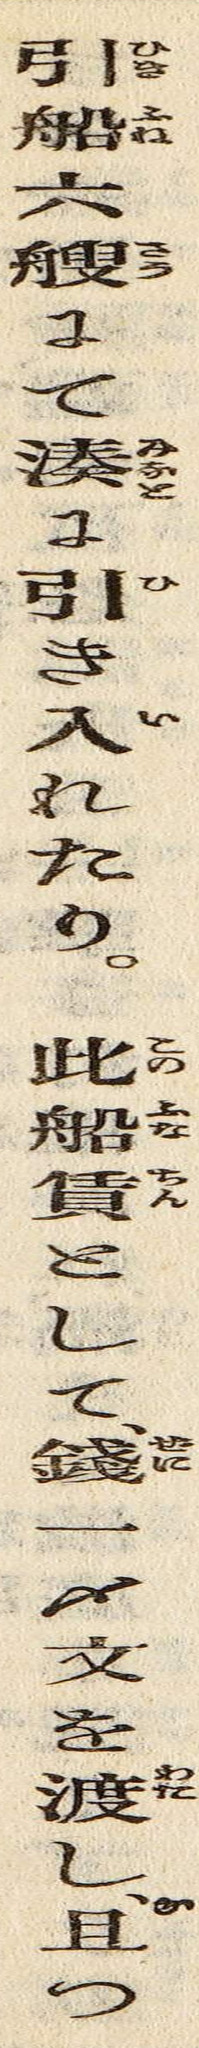引船六艘にて湊に引き入れたり。此船賃として、銭一貫文を渡し、且つ
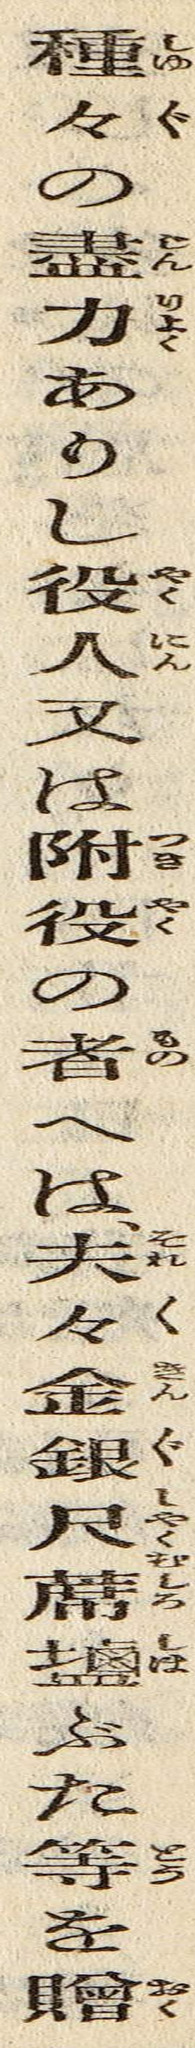種々の尽力ありし役人又は附役の者へは、夫々金銀尺蓆𪉩ぶた等を贈
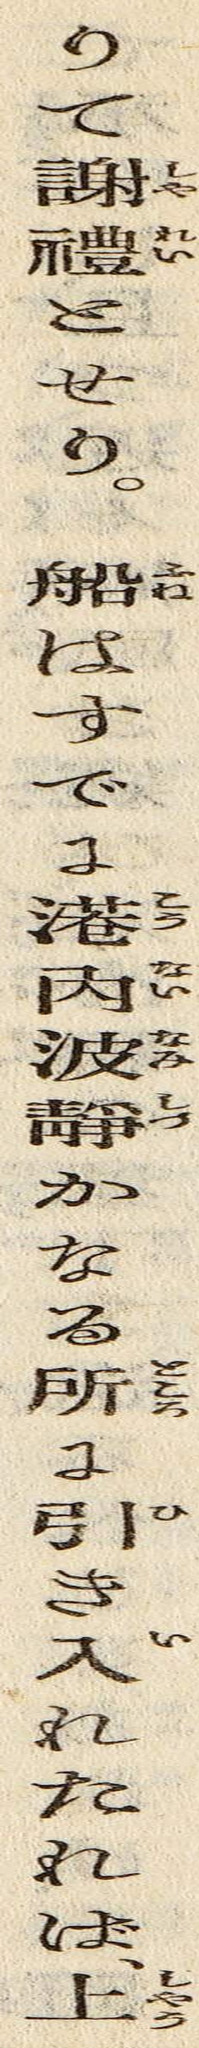りて謝礼とせり。船はすでに港内波静かなる所に引き入れたれば、上
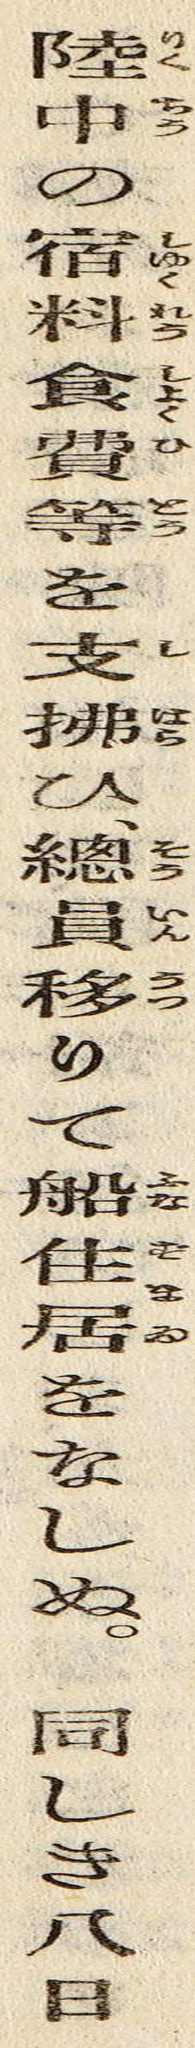陸中の宿料食費等を支払ひ、総員移りて船住居をなしぬ。同しき八日
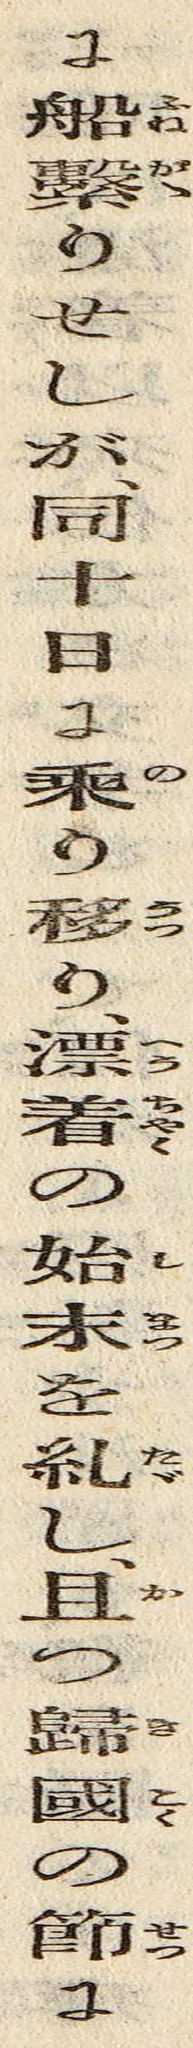に船繫りせしが、同十日に乗り移り、漂着の始末を糺し、且つ帰国の節に
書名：日本漂流譚
